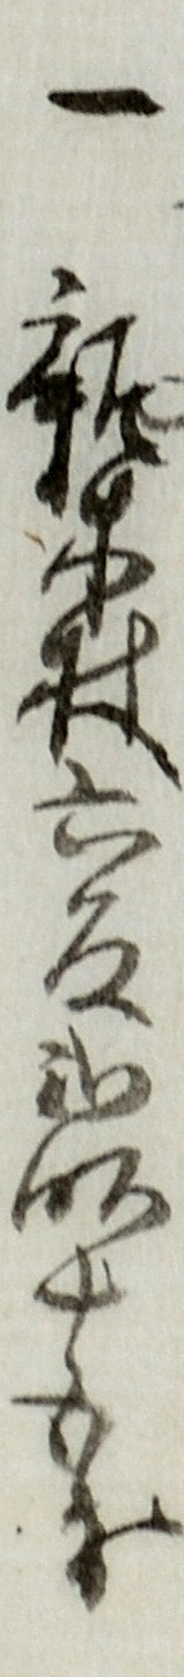一雑木林六反弐畝十五歩
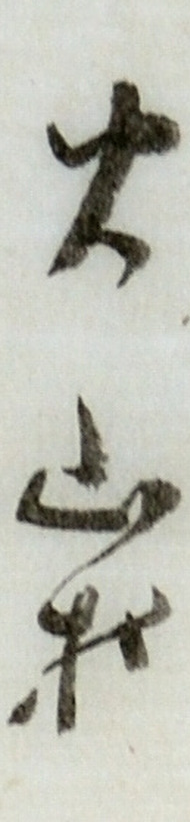火山村
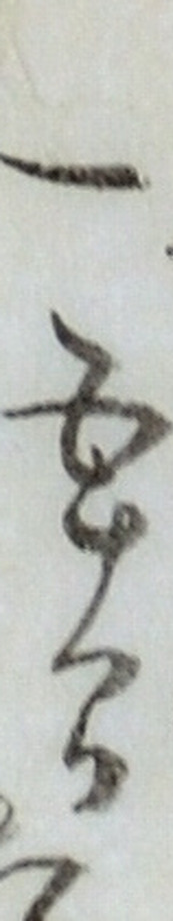一五十間
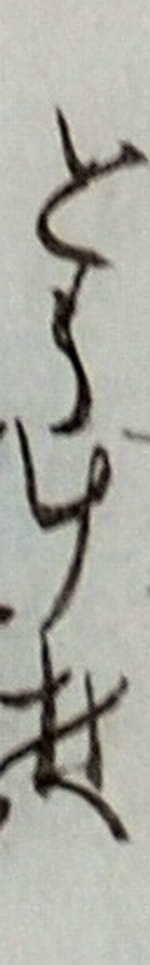とうけ林
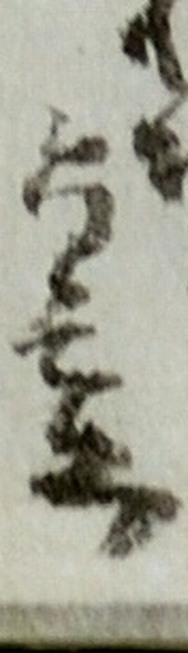与兵衛
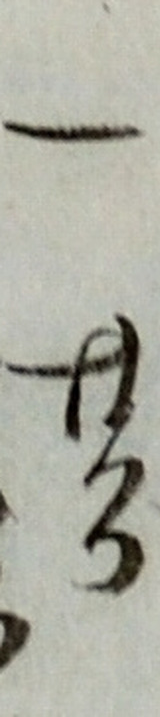一廿間
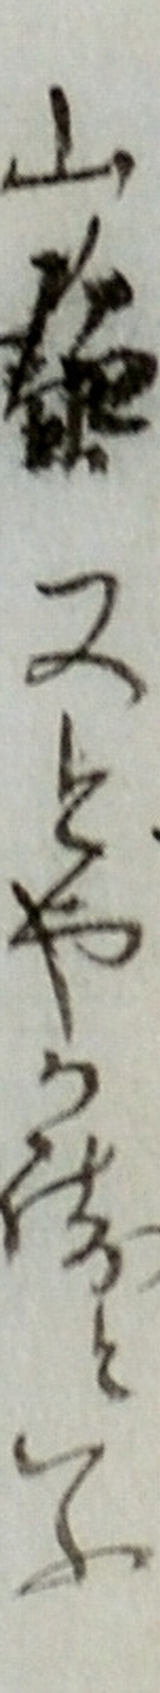山頂又とやケといふ
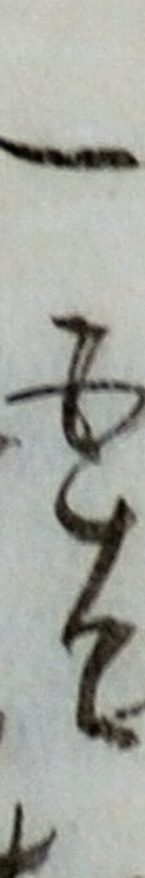一五十間
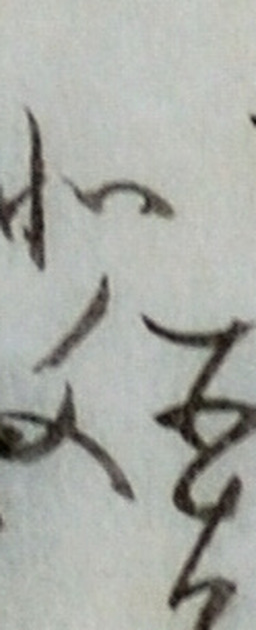北ノ入

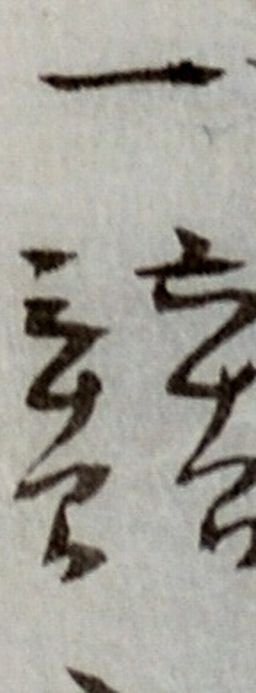一六十間
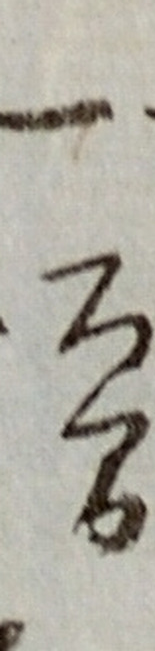一廿間
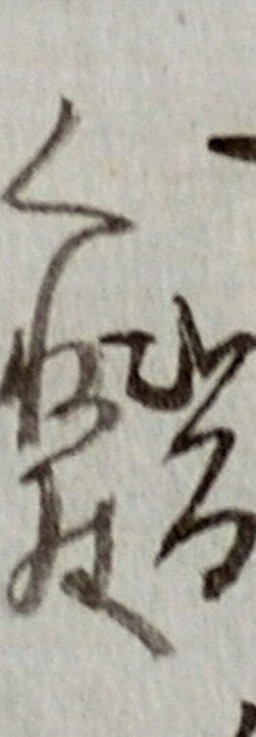くね林
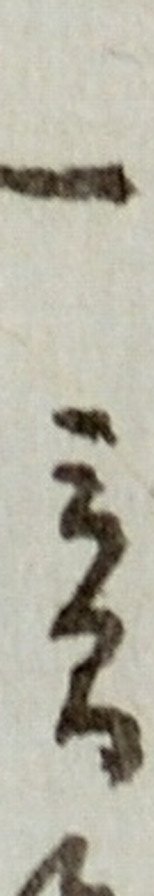一廿間
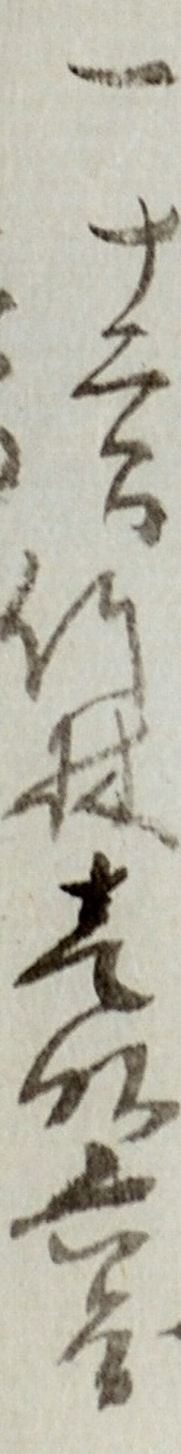一十二間竹林壱畝六歩
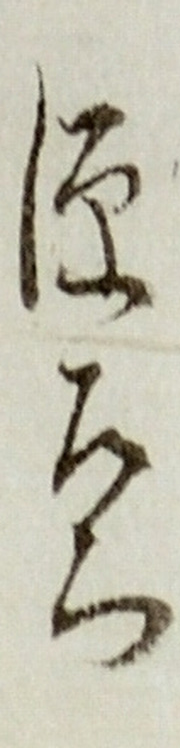九左衛門
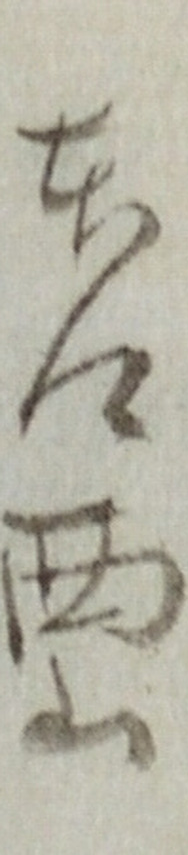本郷西山
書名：中澤郷御林控
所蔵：伊那市立高遠町図書館・合同会社AMANE
